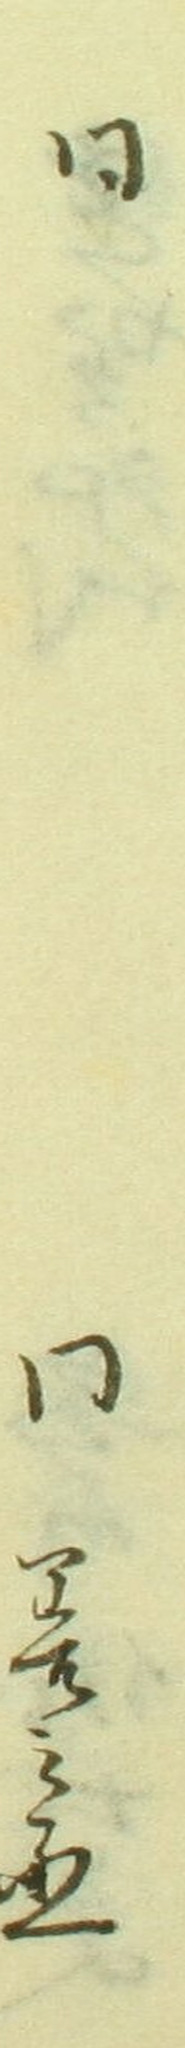同同善之亟
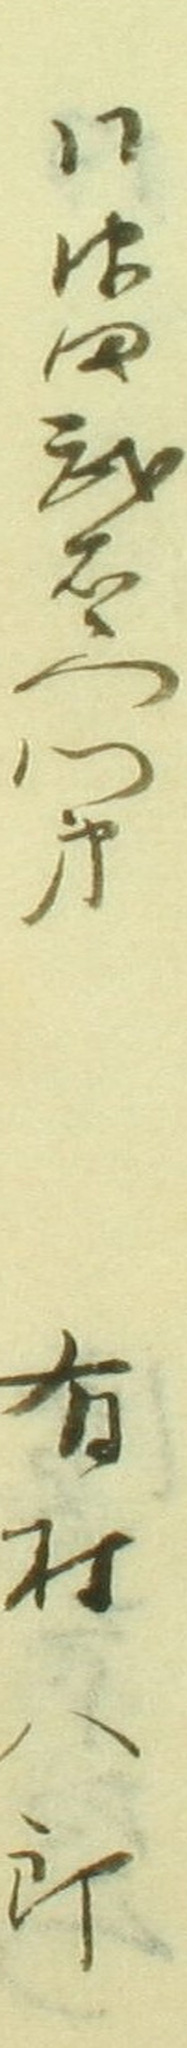同津田武右衛門門弟有村八郎
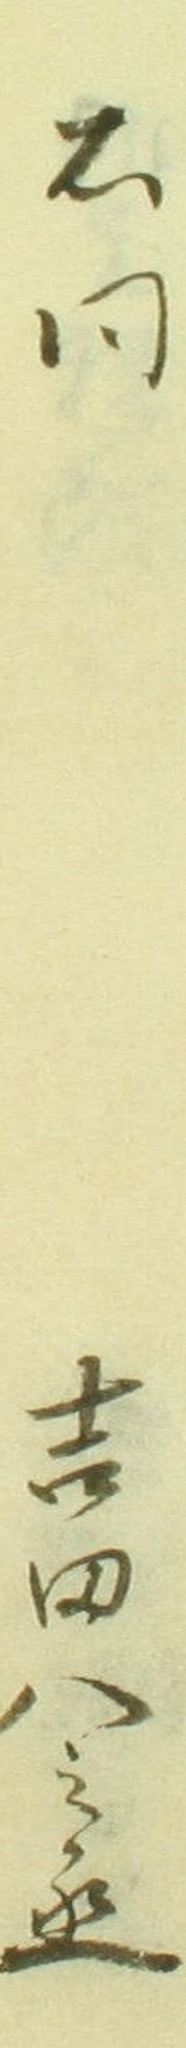右同吉田八之亟
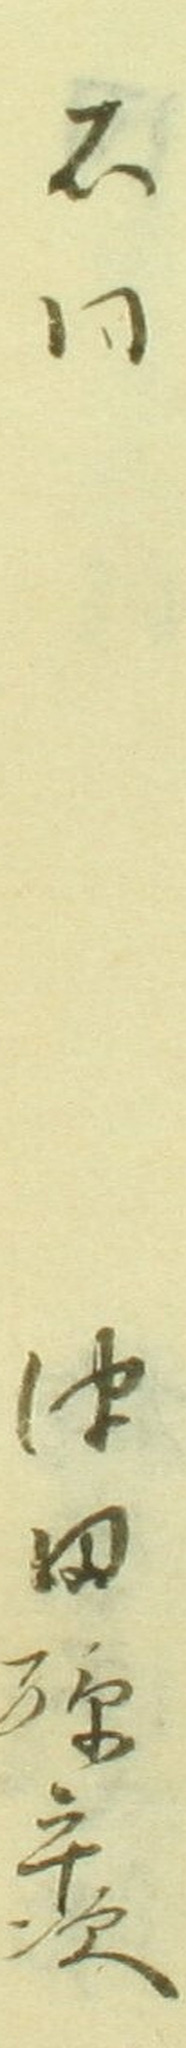右同津田孫平次
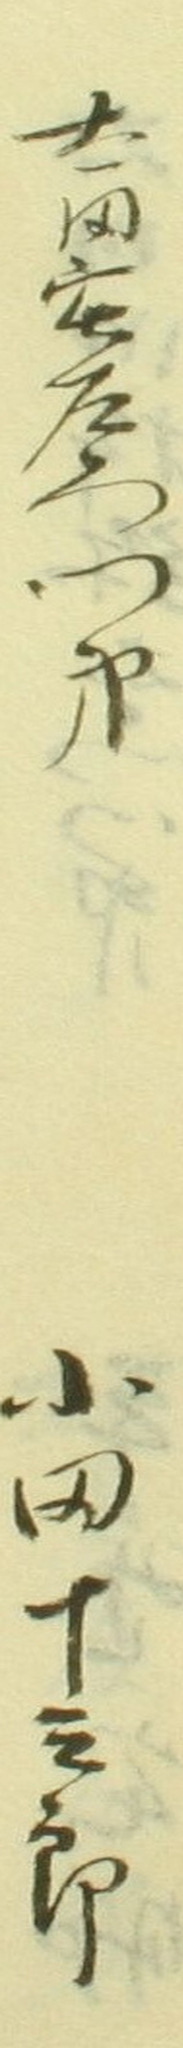吉田宅左衛門門弟小田十三郎
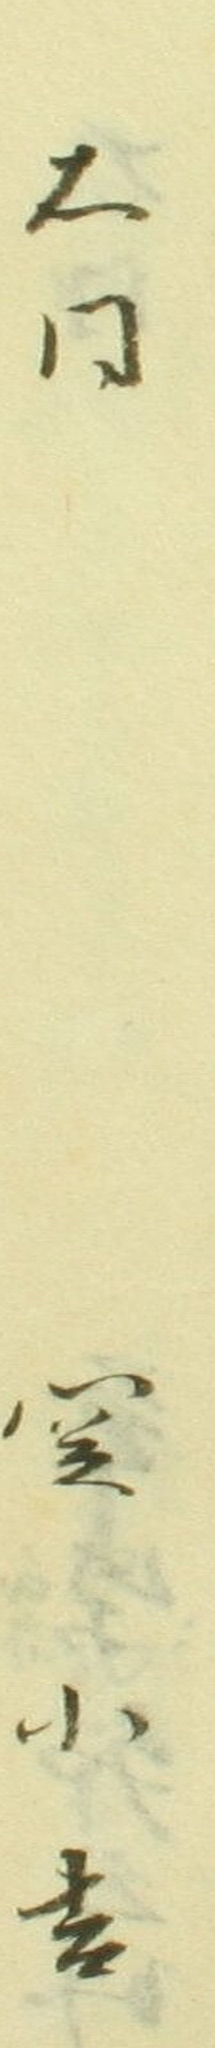右同関小吉
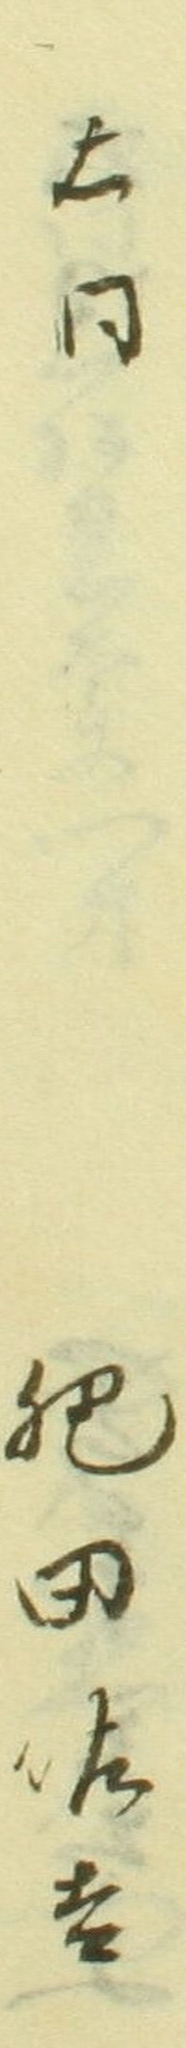右同肥田佐吉
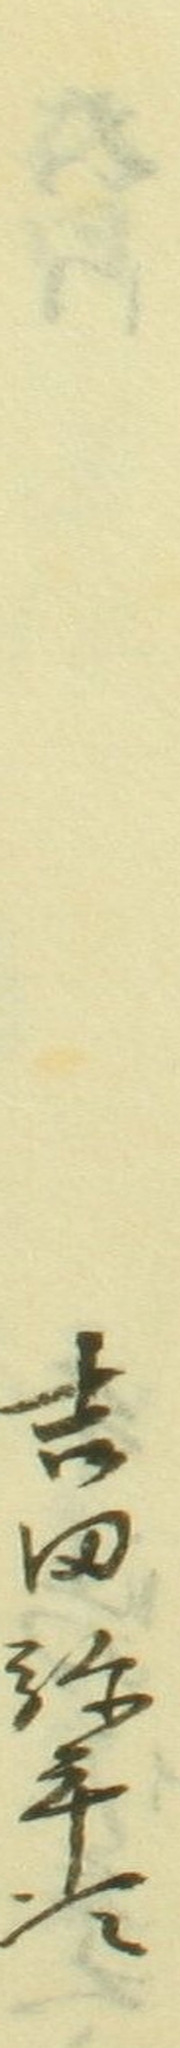吉田弥平次
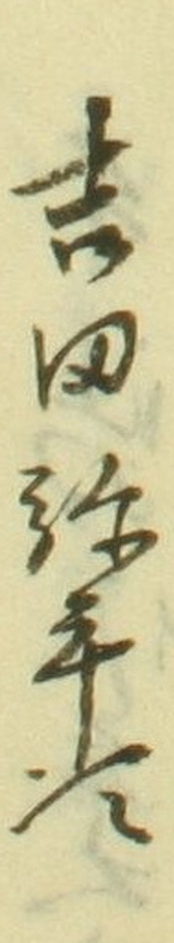吉田弥平次
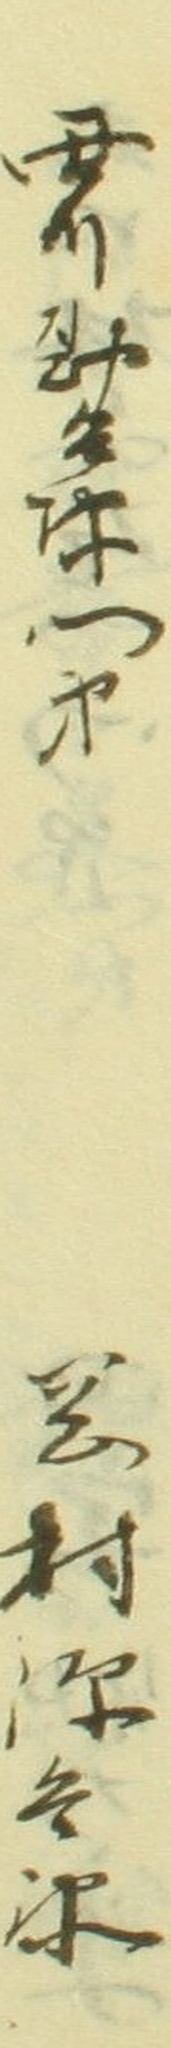西川勘兵衛門弟岡村源兵衛
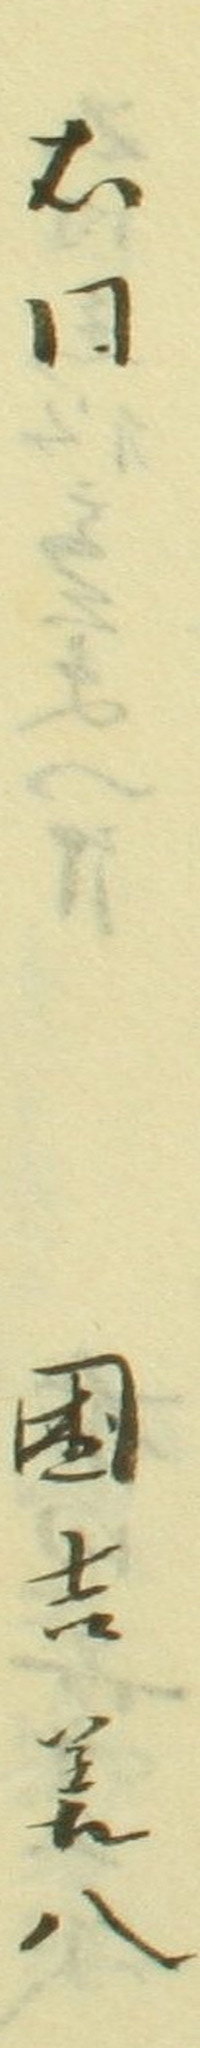右同国吉善八
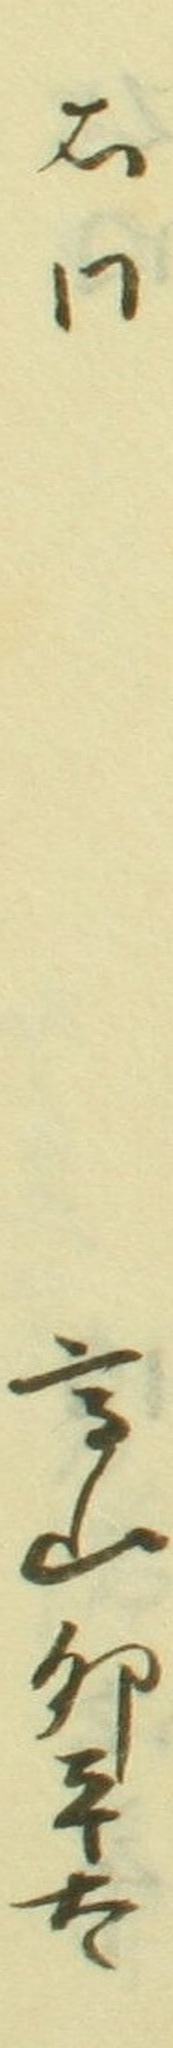右同高山卯平太
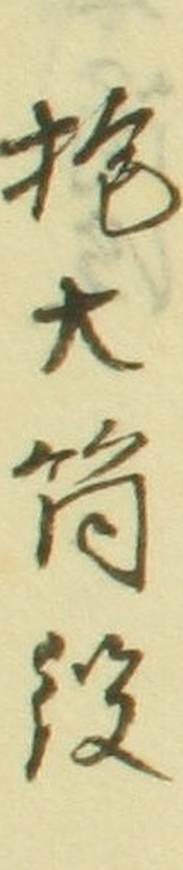抱大筒役
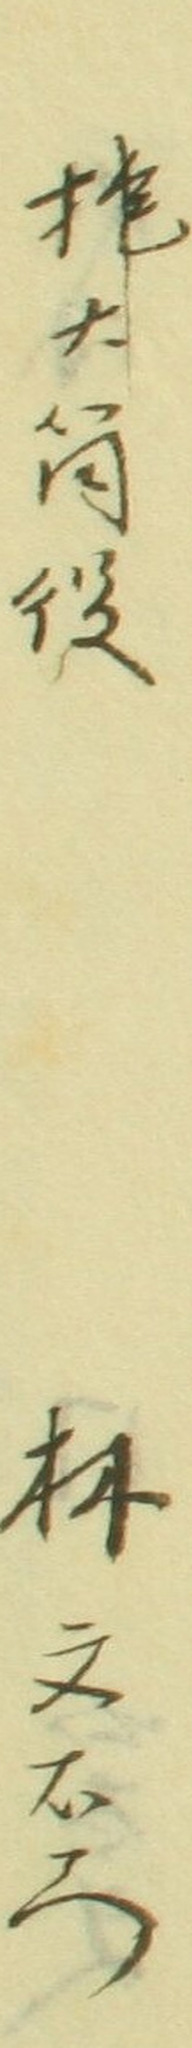抱大筒役林文右衛門

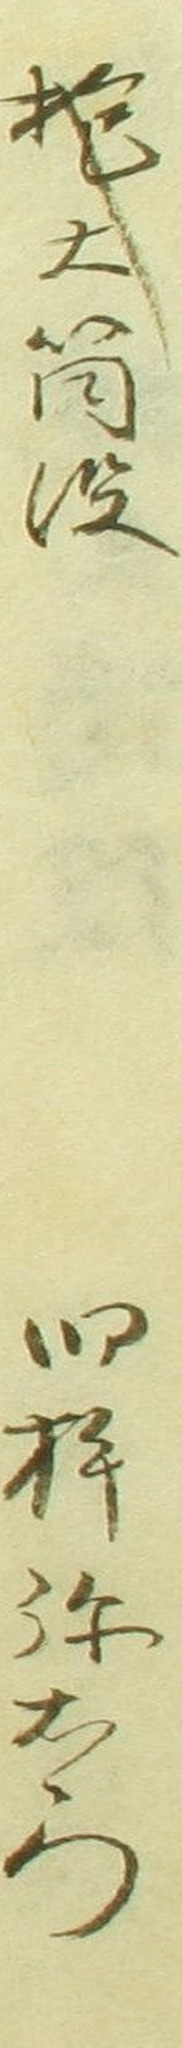抱大筒役臼杵弥右衛門
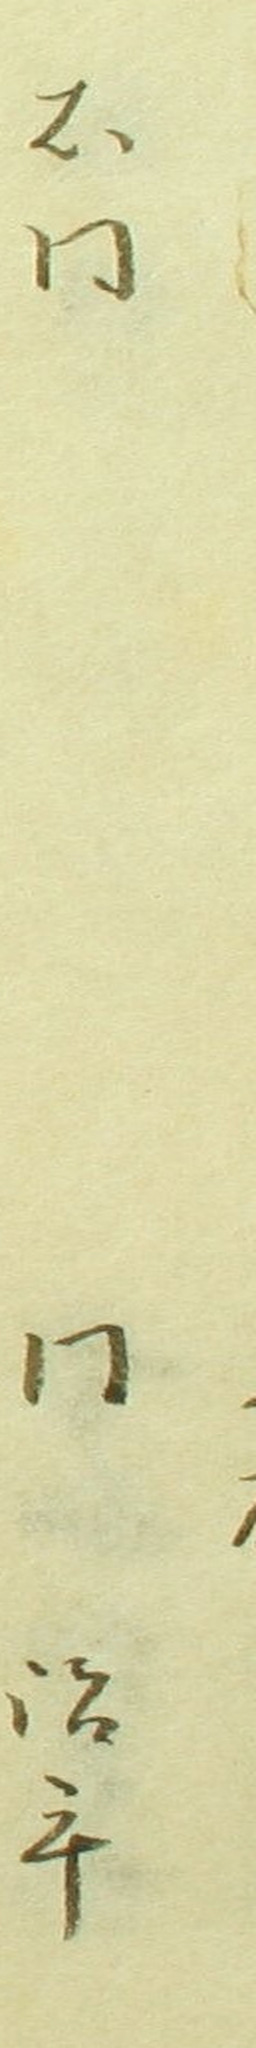右同同治平
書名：唐船漂流記 二
